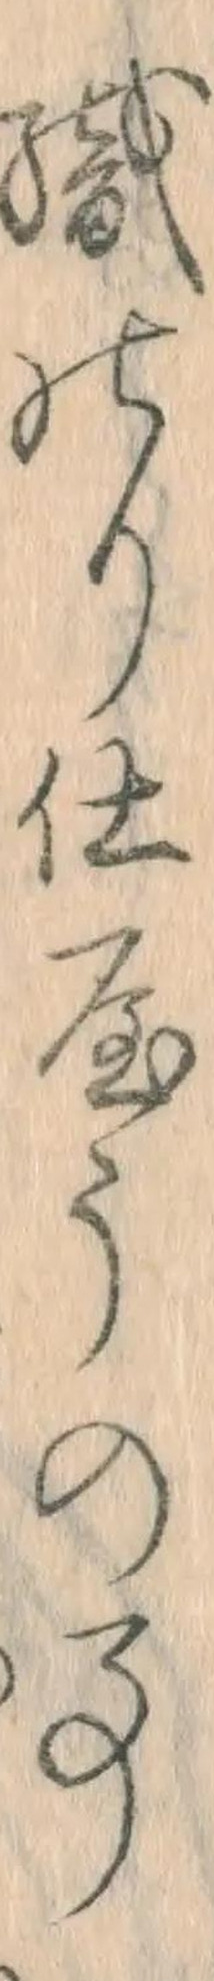織のり仕やうの事
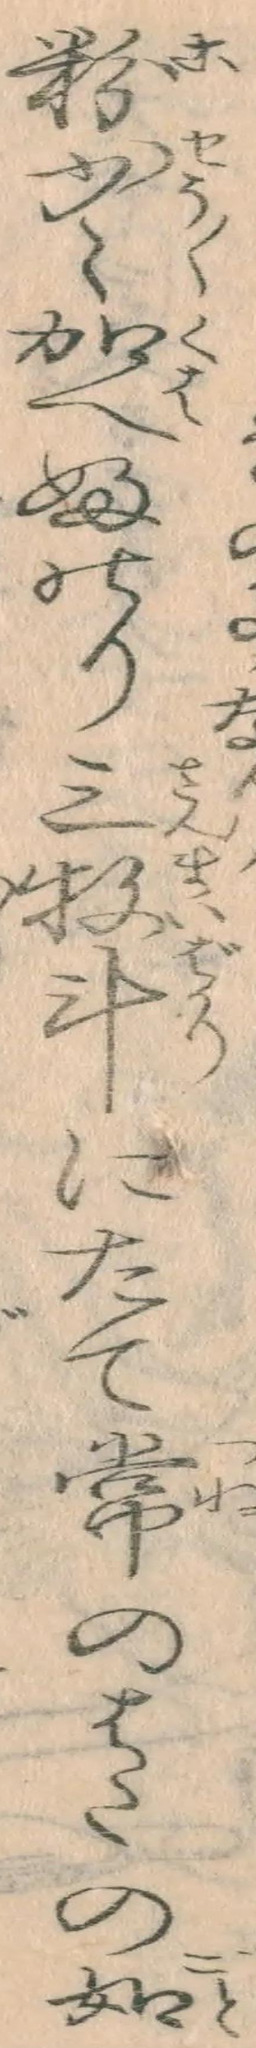粉少々加へふのり三枚斗にたて常のはたの如
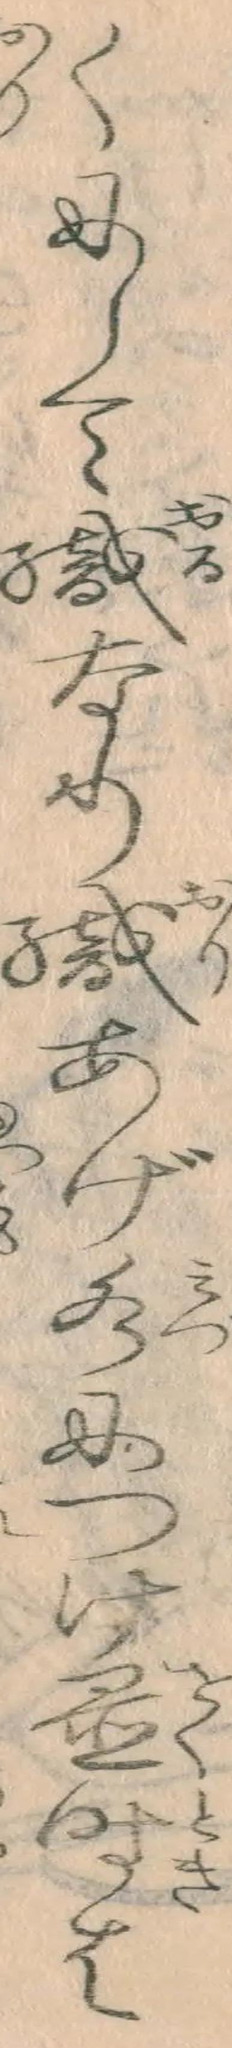くにして織なり織あげ水につけ置時は
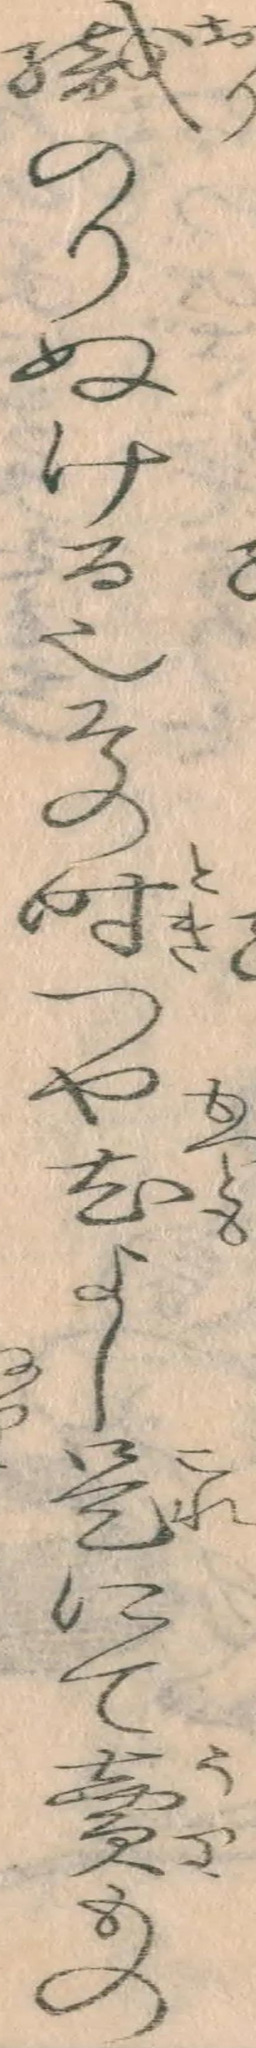織のりぬける也その時つや尤よし是にて売もの
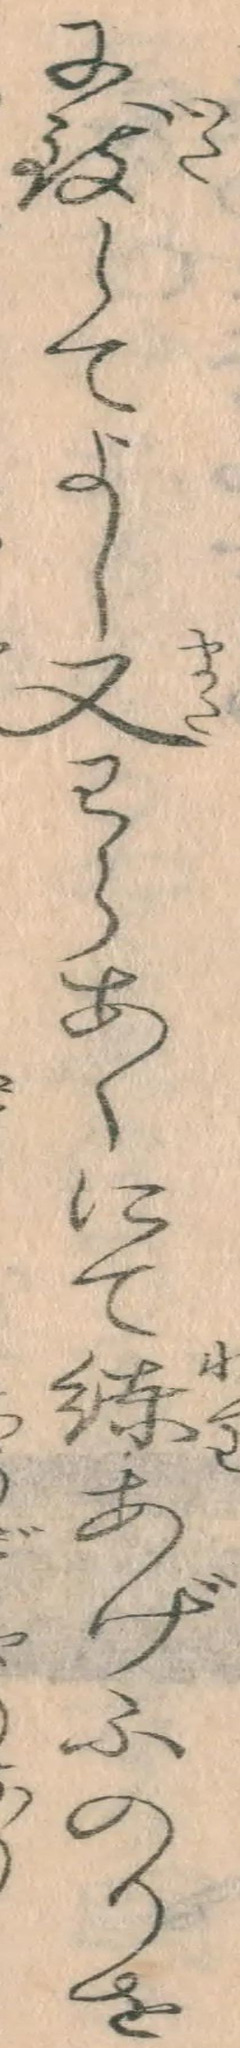に致してよし又わらあくにて煉あげふのりを
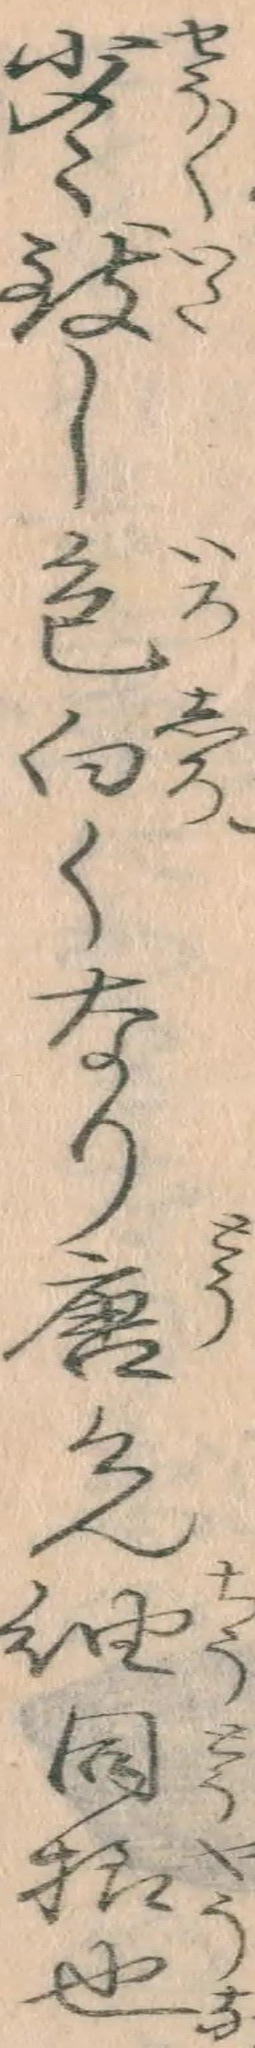少々致し色白くなり唐けん紬同様也
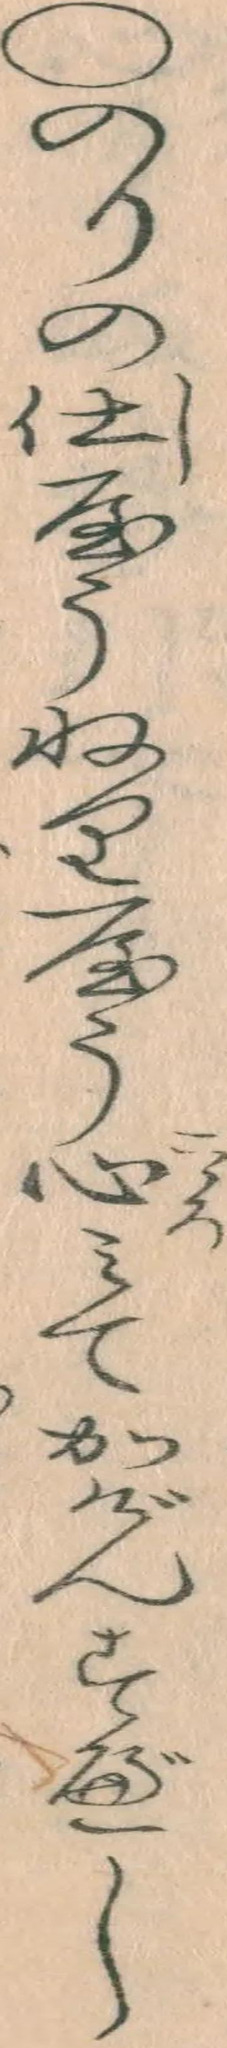○のりの仕やうねりやう心みてかげんすべし
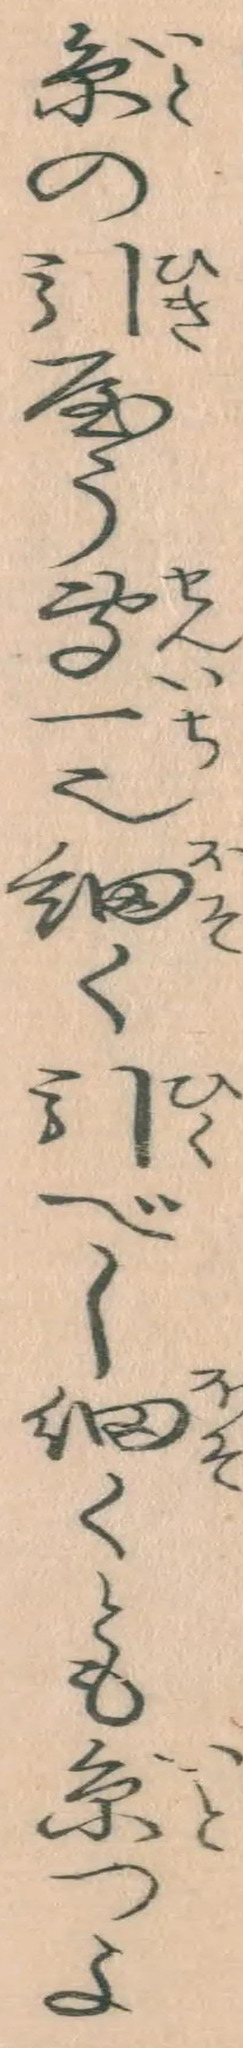糸の引やう専一也細く引べし細くとも糸つよ
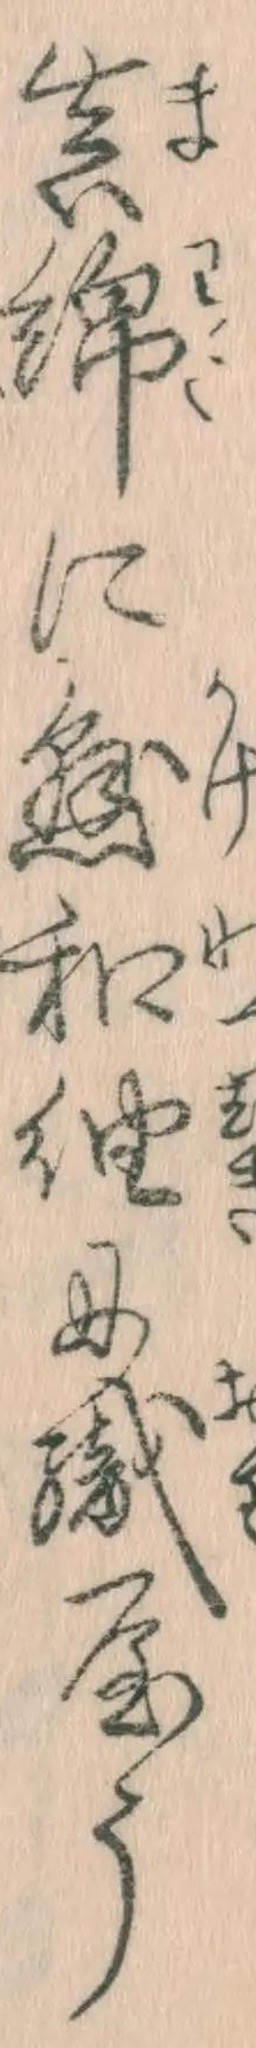真綿に懸和紬に織やう
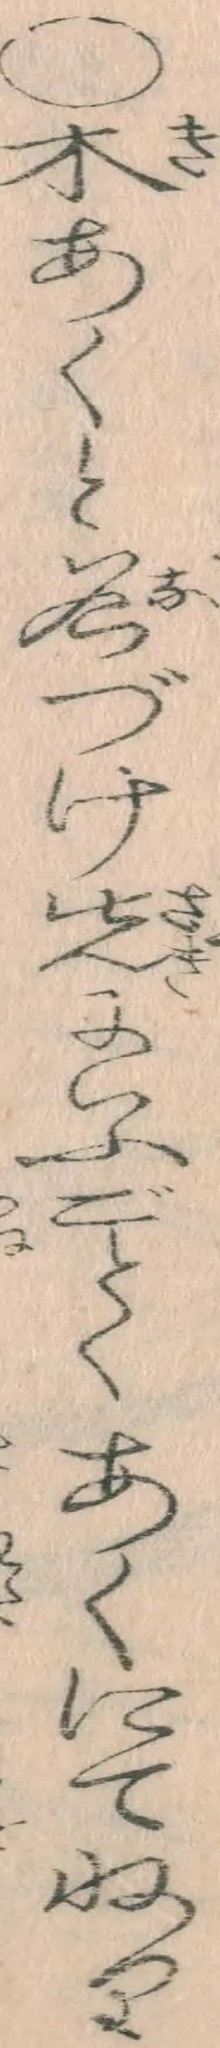○木あくと名づけ先にいふごとくあくにてねり
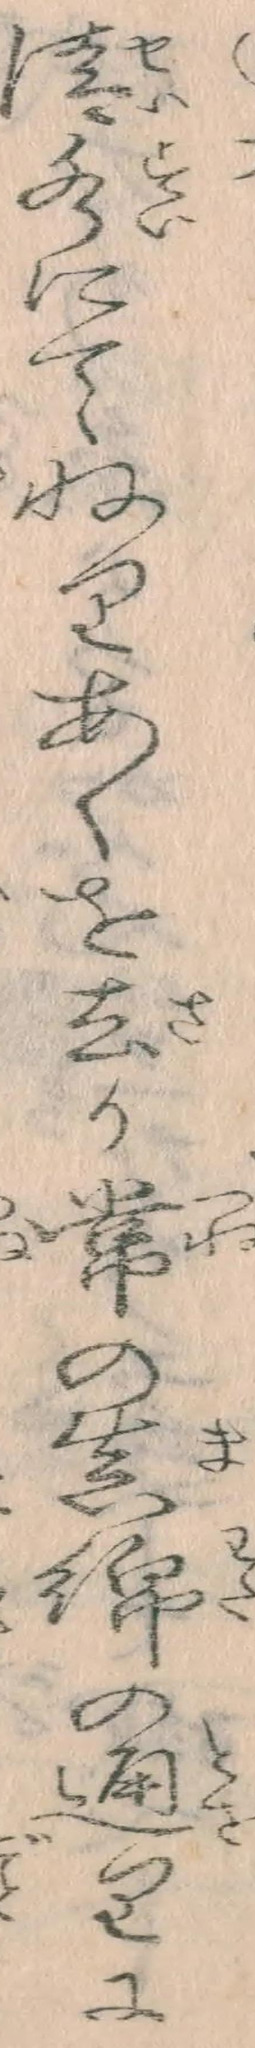清水にてねりあくを去り常の真綿の通りに
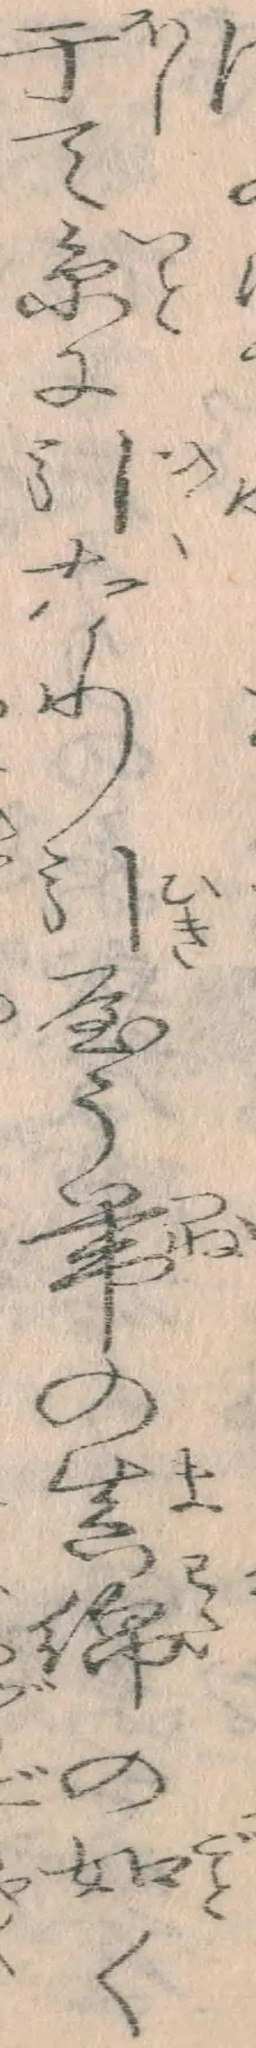干て糸に引なり引やう常の真綿の如く
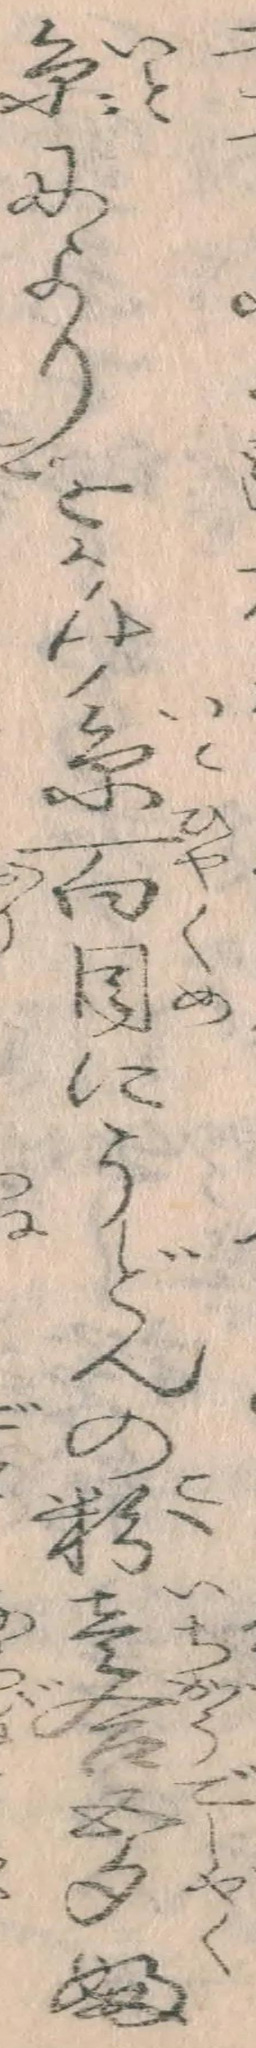糸によりをかけ糸百目にうどんの粉壱合五勺ふ
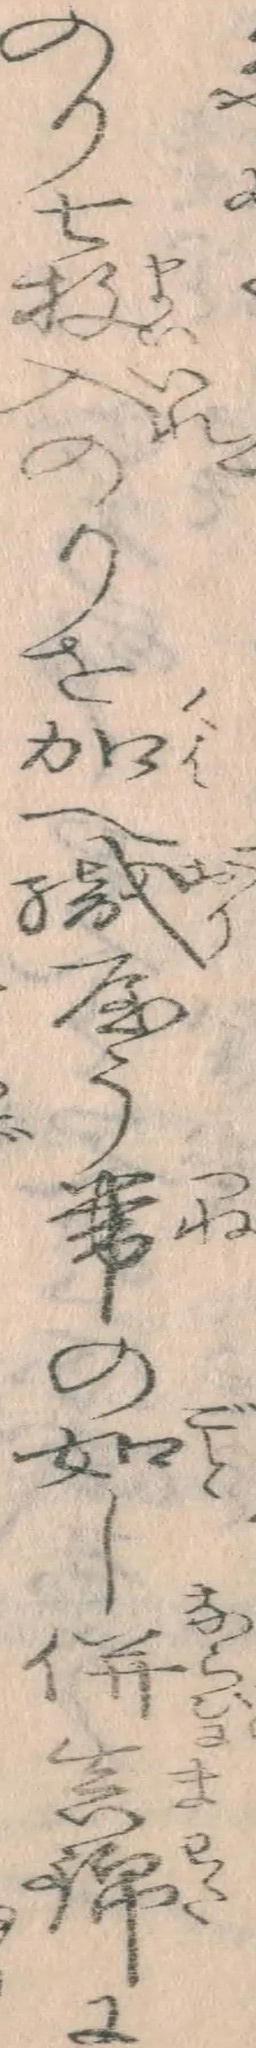のり七枚入のりを加へ織やう常の如し併真綿に
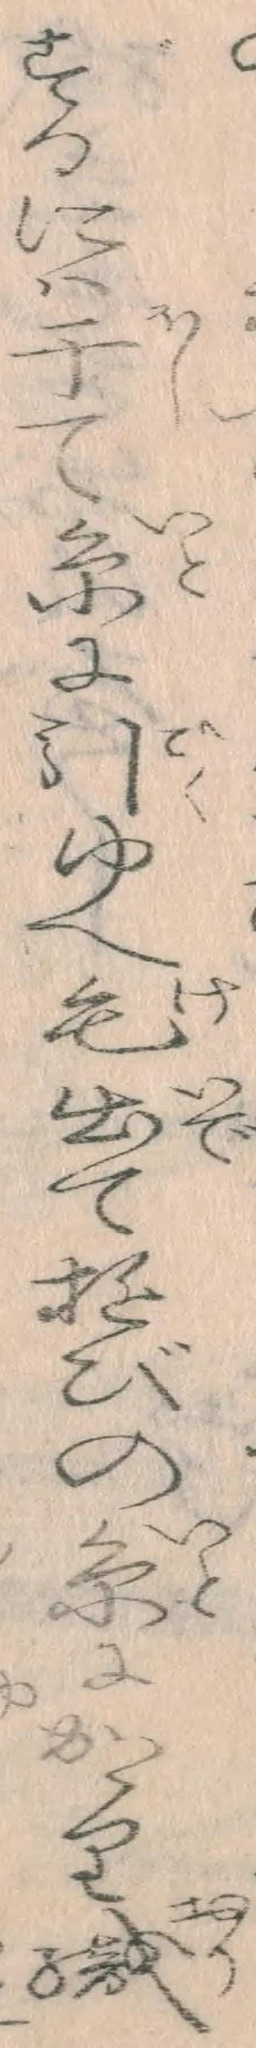するには干て糸に引ゆへ毛出て遊びの糸にかゝり織
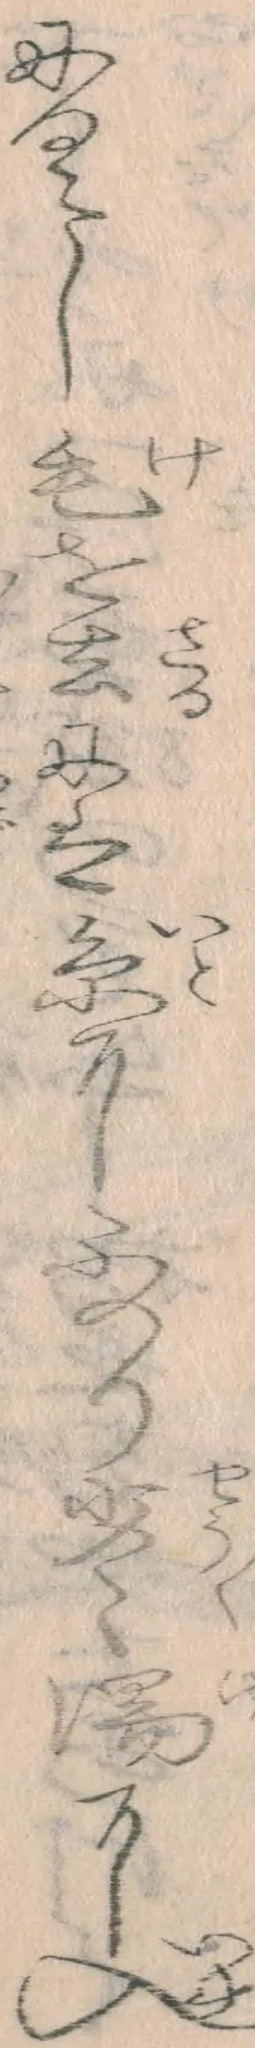にくし毛を去には糸にふのり少々湯に入
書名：山繭養法秘傳抄
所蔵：国立国会図書館 National Diet Library, JAPAN
